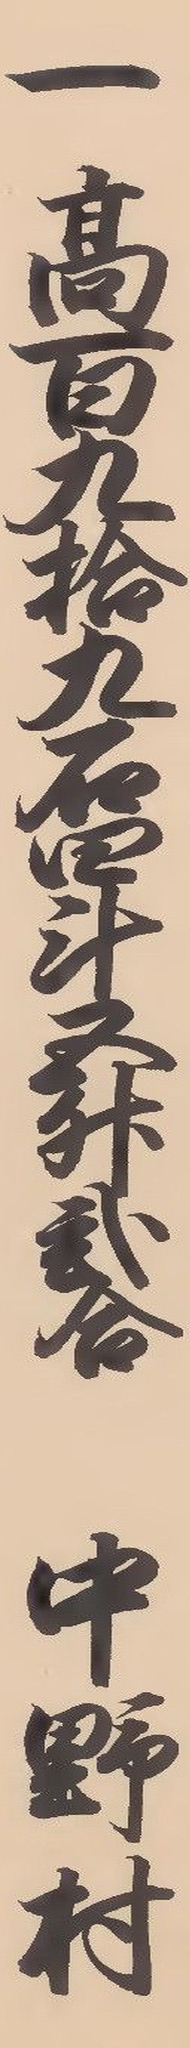一高百九拾九石四斗五升弐合中野村
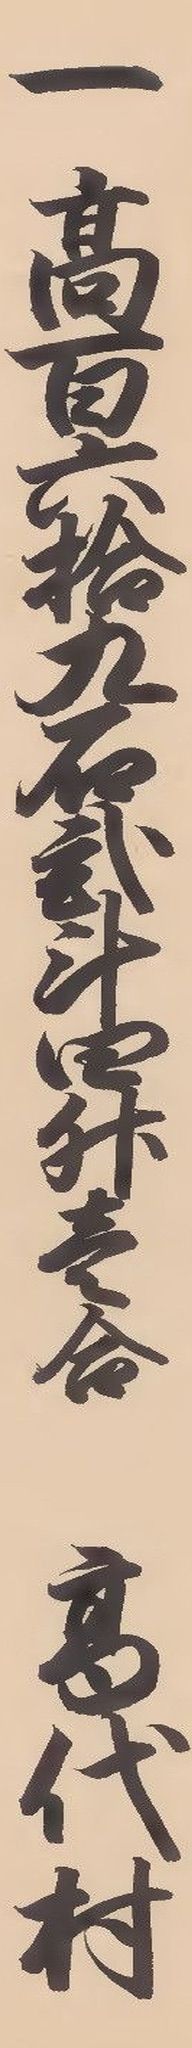一高百六拾九石弐斗四升壱合高代村
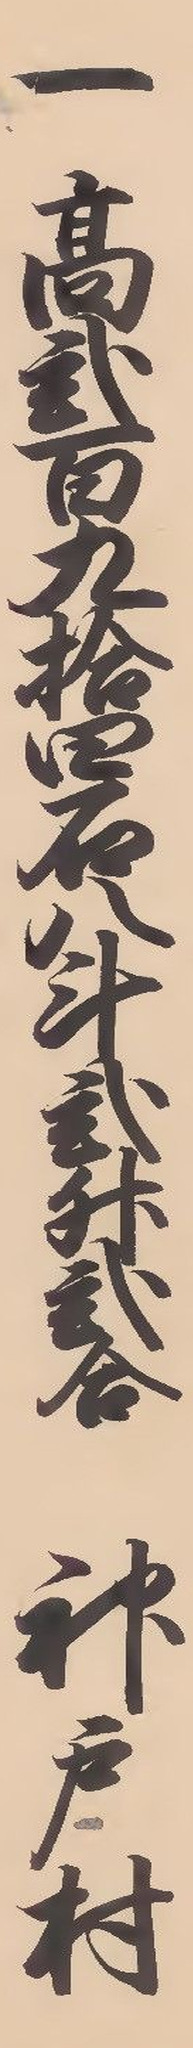一高弐百九拾四石八斗弐升弐合神戸村

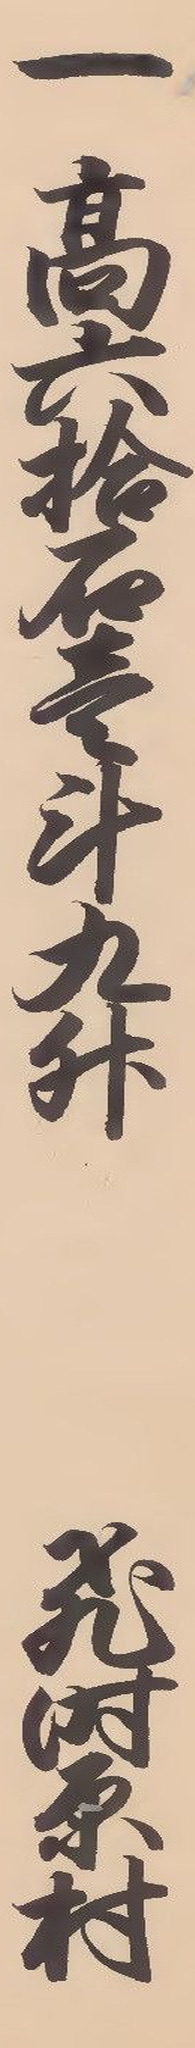一高六拾石壱斗九升飛時原村
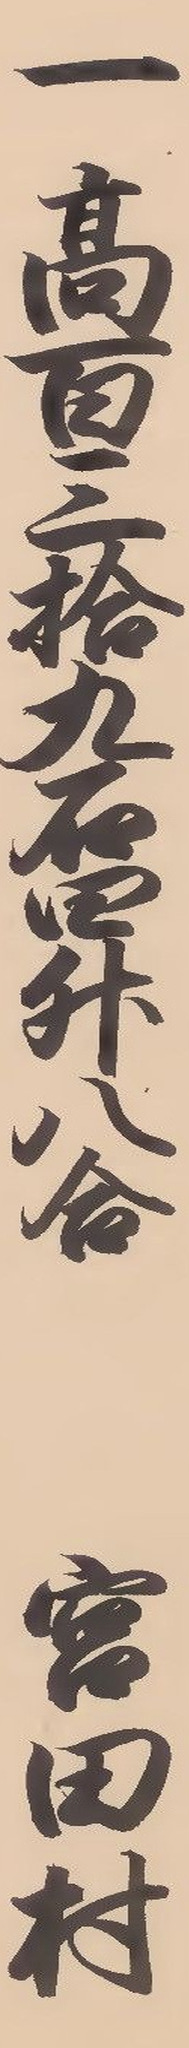一高百三拾九石四升八合宮田村
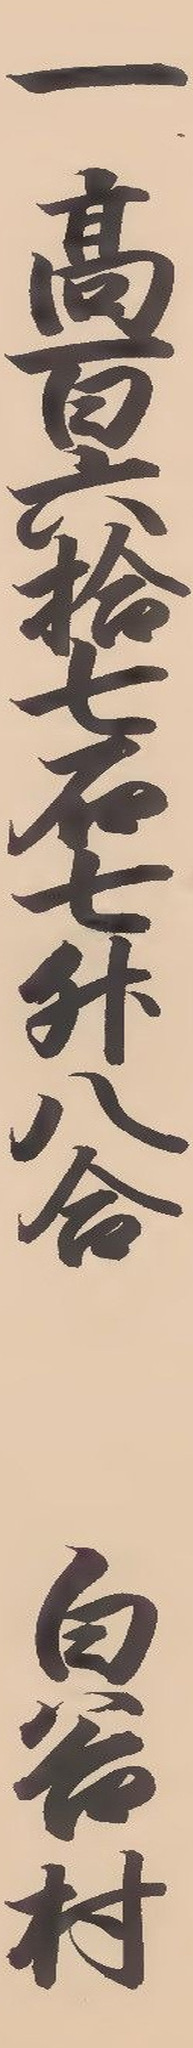一高百六拾七石七升八合白谷村
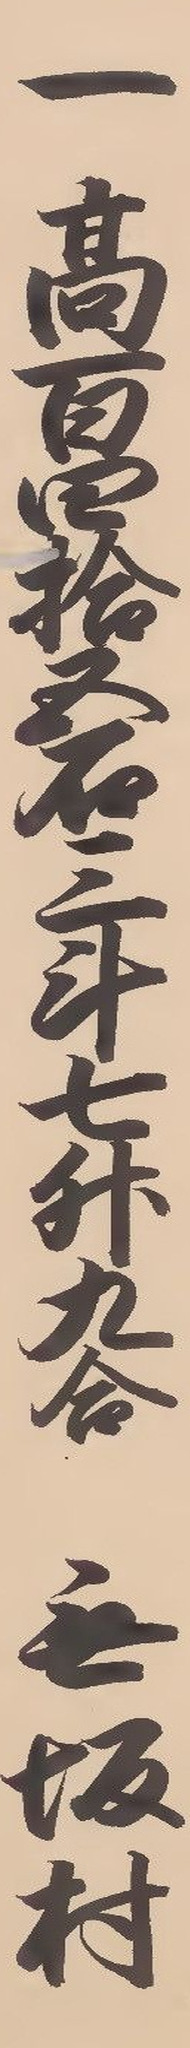一高百四拾五石三斗七升九合無坂村
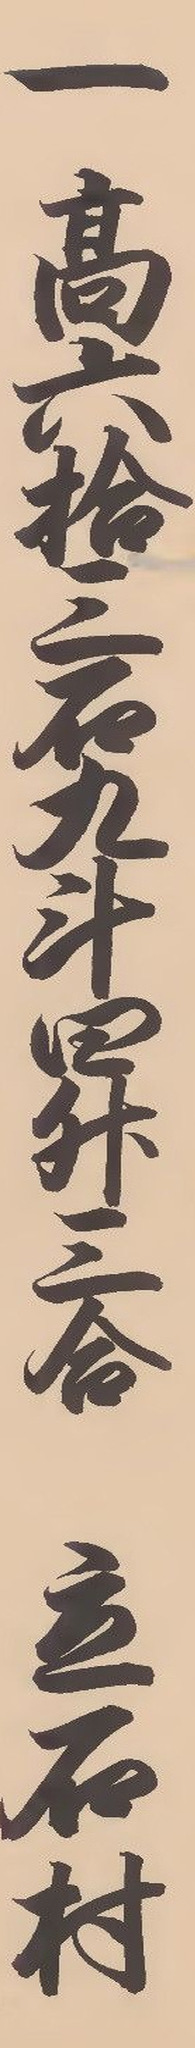一高六拾三石九斗四升三合立石村
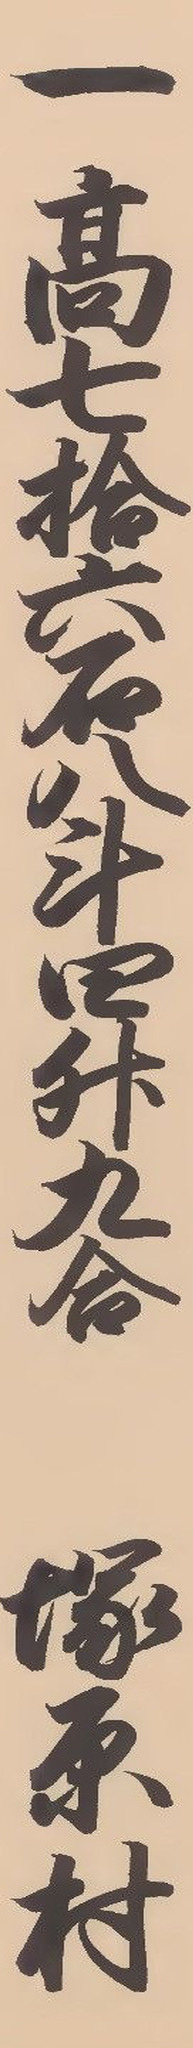一高七拾六石八斗四升九合塚原村
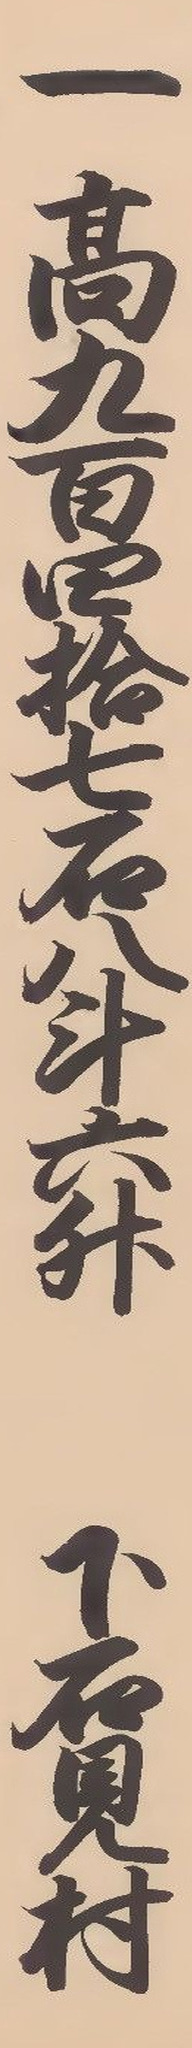一高九百四拾七石八斗六升下石見村
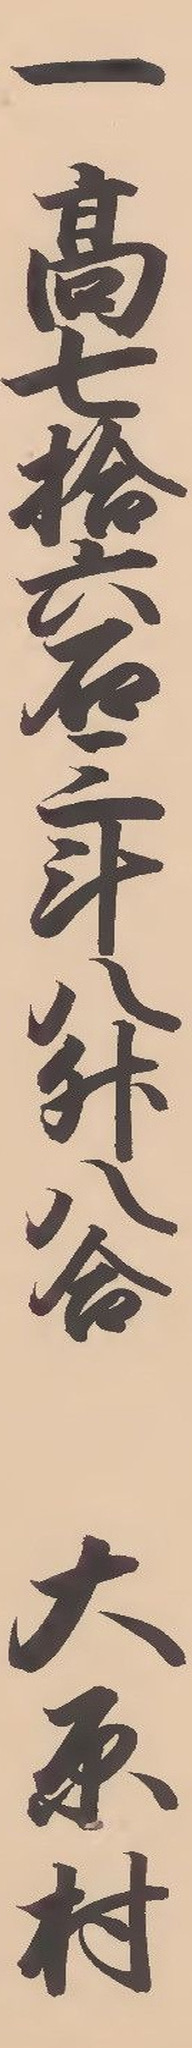一高七拾六石三斗八升八合大原村

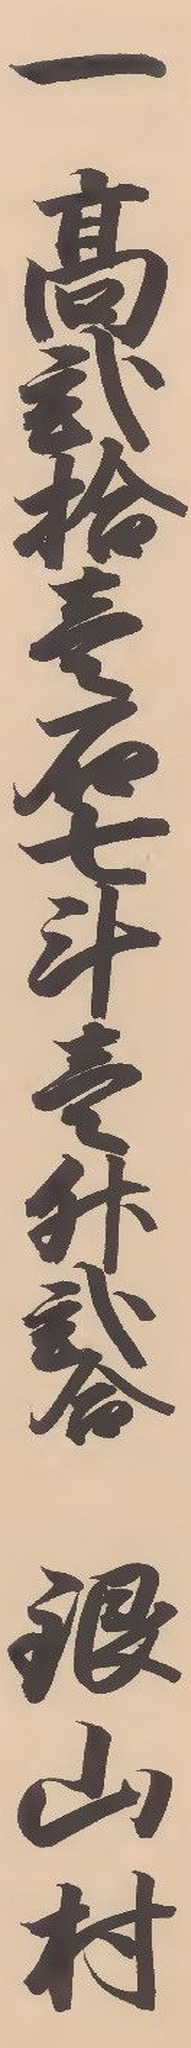一高弐拾壱石七斗壱升弐合銀山村
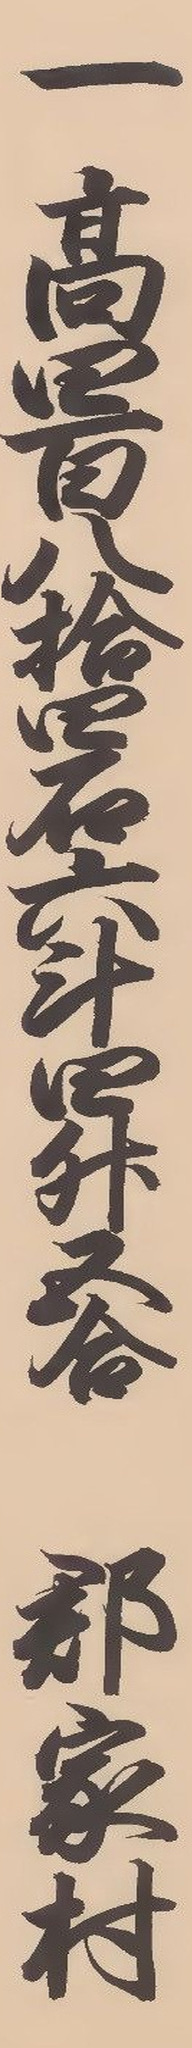一高四百八拾四石六斗四升五合郡家村
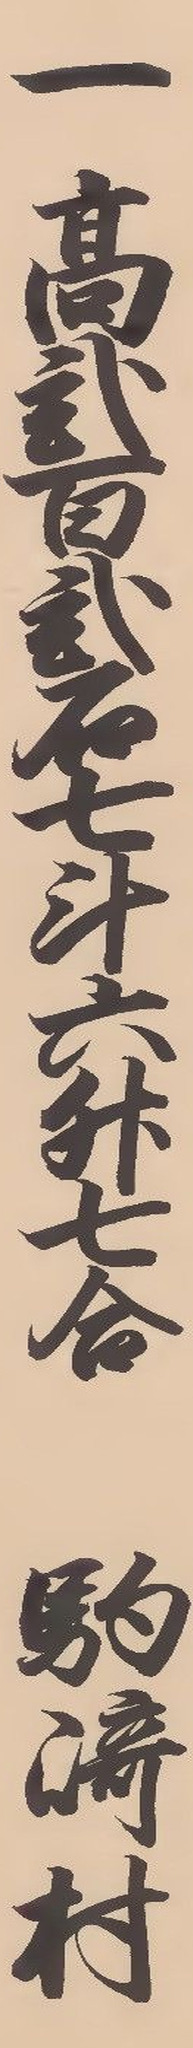一高弐百弐石七斗六升七合駒崎村
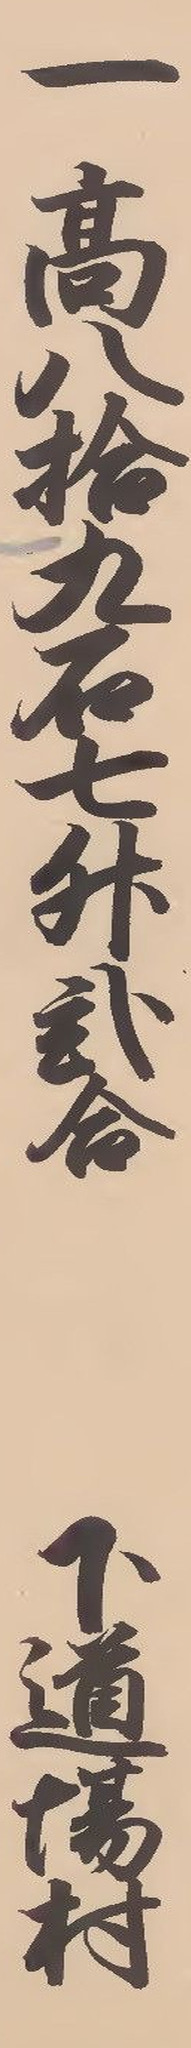一高八拾九石七升弐合下道場村
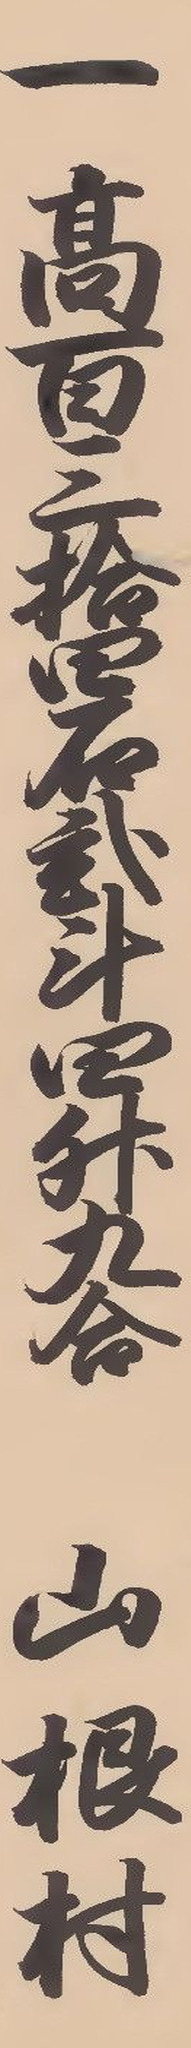一高百三拾四石弐斗四升九合山根村
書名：伯耆国郷帳
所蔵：国立公文書館 National Archives of Japan
